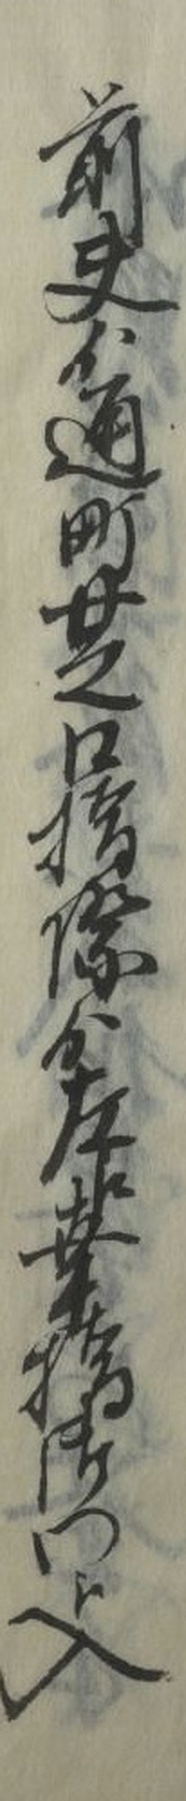前夫ゟ通町芝口橋際ゟ左え幸橋御門え入
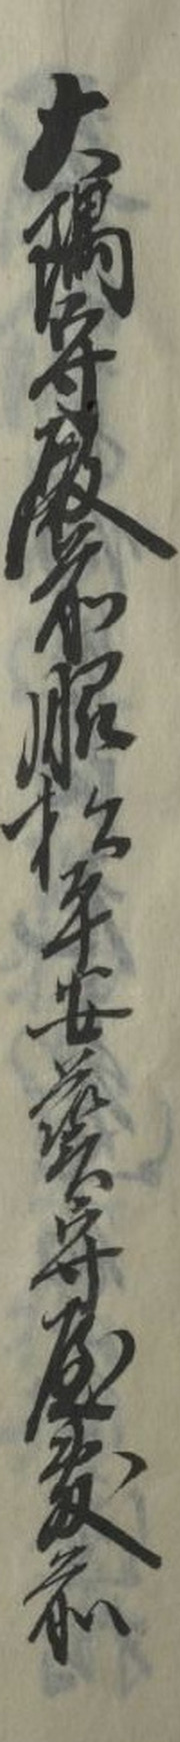大隅守殿前脇松平安芸守屋敷前
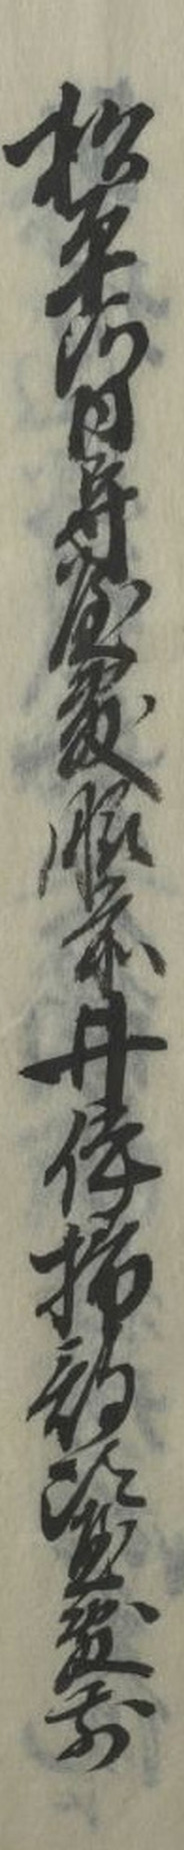松平河内守屋敷脇前井伊掃部頭屋敷前
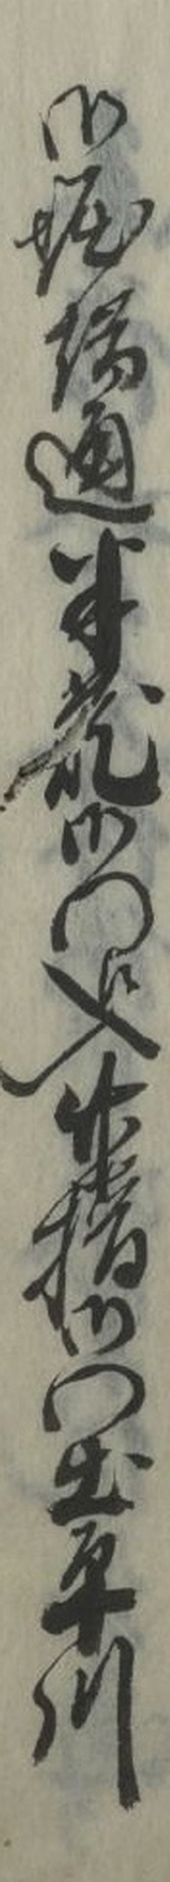御堀端通半蔵御門え入竹橋御門出平川
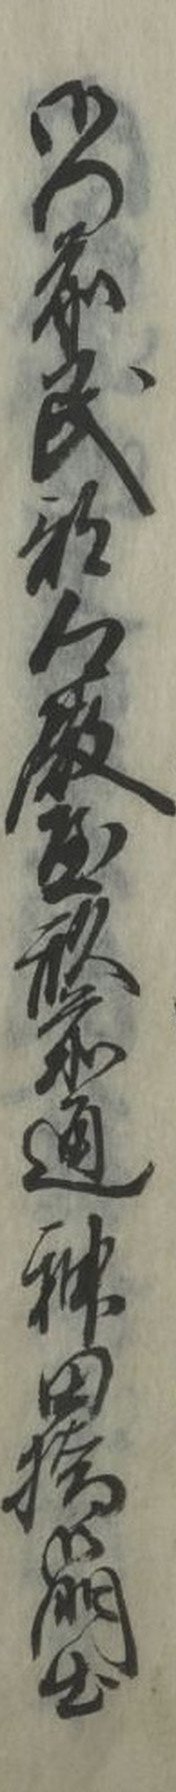御門前民部卿殿屋形前通神田橋御門出
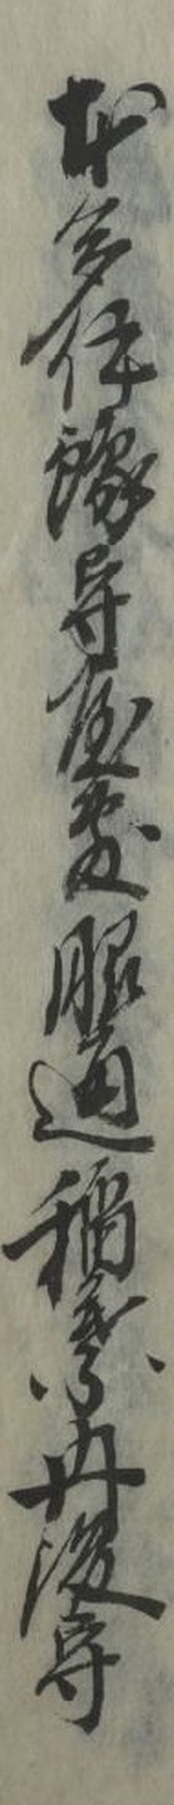本多伊予守屋敷脇通稲葉丹後守

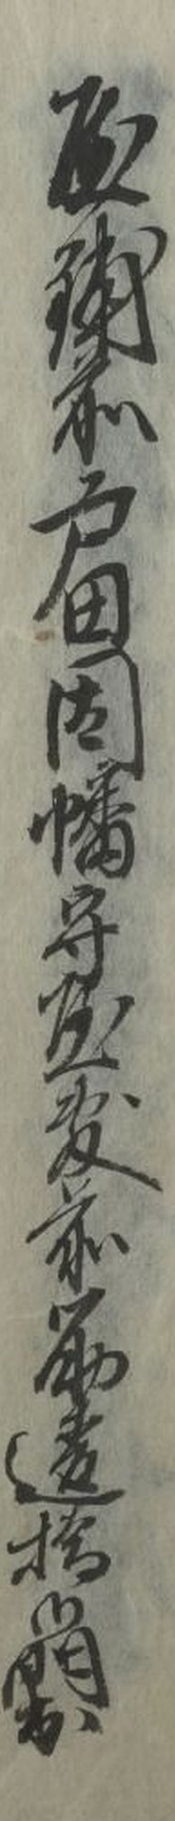屋鋪前戸田因幡守屋敷前筋違橋御門出
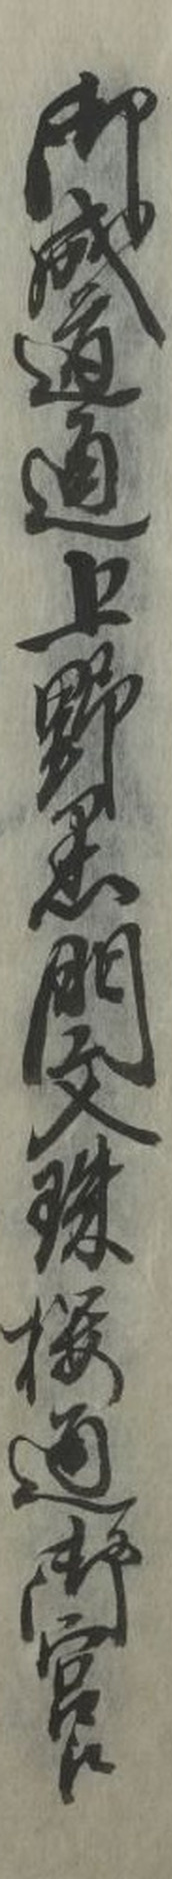御成道通上野黒門文殊楼通御宮え
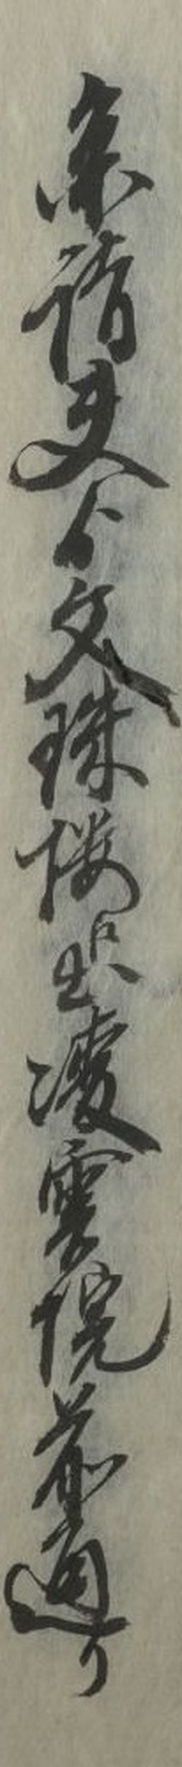参詣夫ゟ文殊楼え出凌雲院前通り
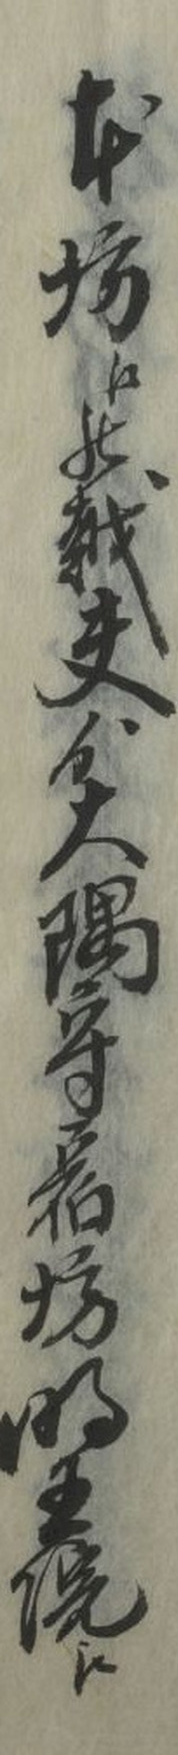本坊え罷越夫ゟ大隅守宿坊明王院え
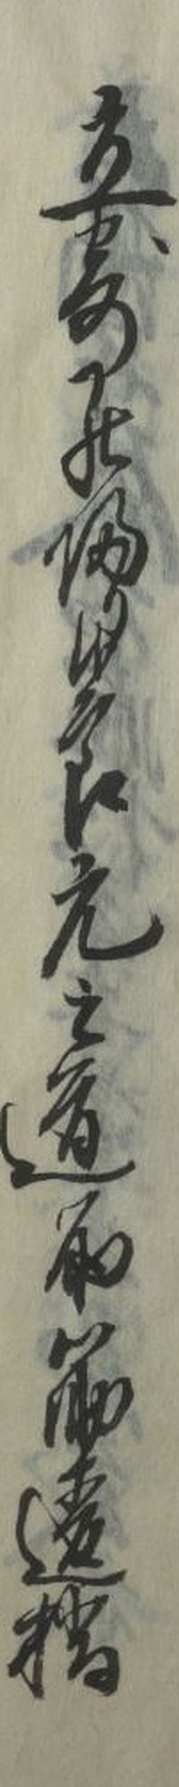立寄罷帰り候節元之道筋筋違橋
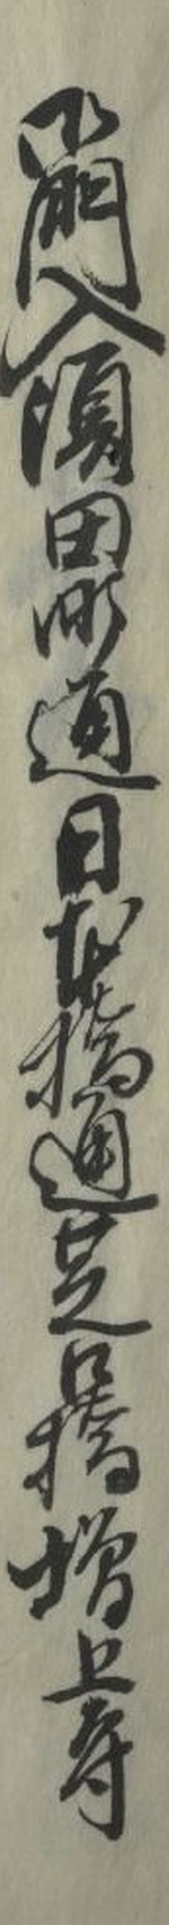御門入須田町通日本橋通芝口橋増上寺
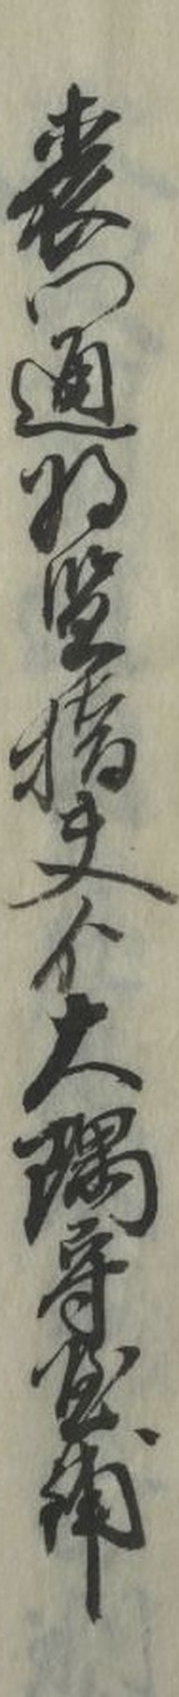表門通将監橋夫ゟ大隅守屋鋪
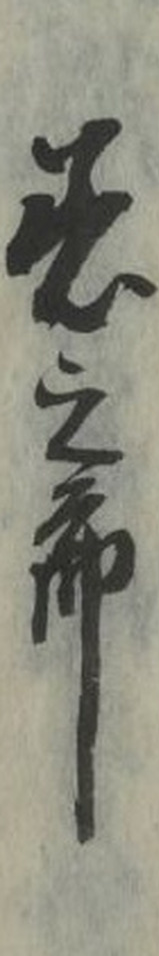着之筋
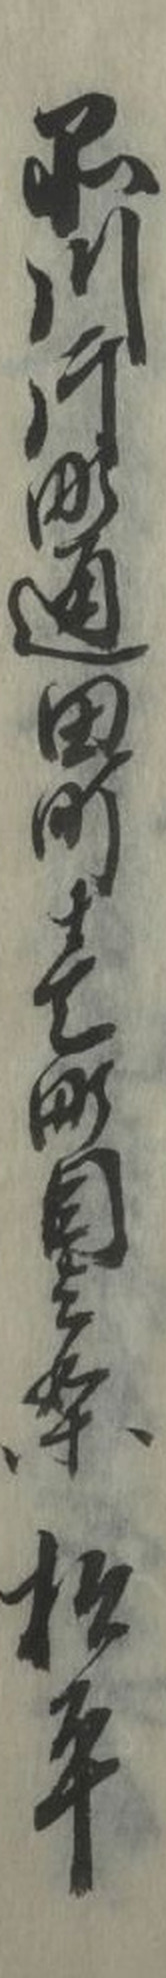品川片町通田町壱町目より松平

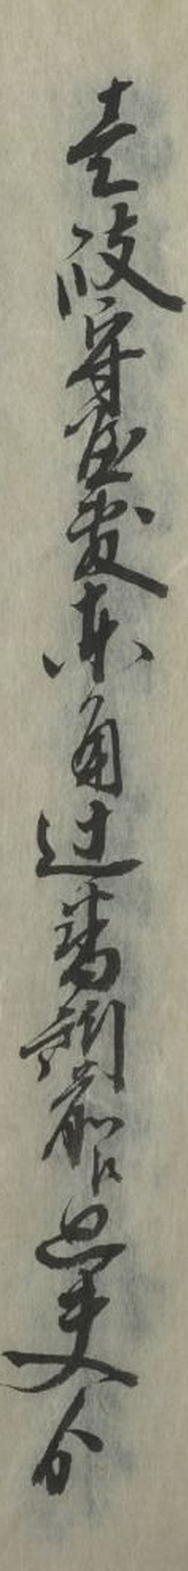壱岐守屋敷東角辻番所前え廻夫ゟ
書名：天保三壬辰年・琉球人参府・弐朱吹立御触写
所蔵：University of the Ryukyus Library
